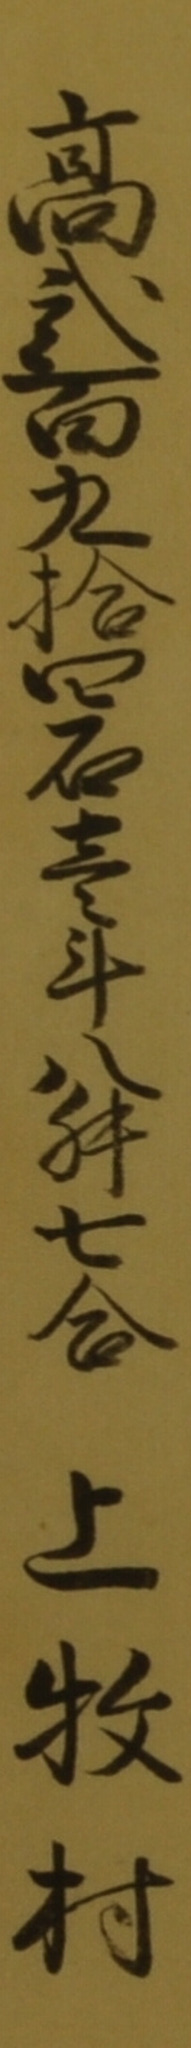一高弐百九拾四石壱斗八升七合上牧村

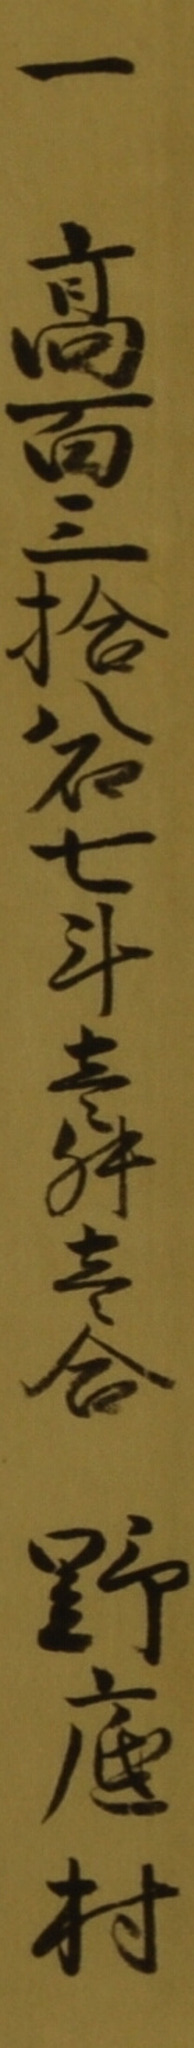一高百三拾八石七斗壱升壱合野底村
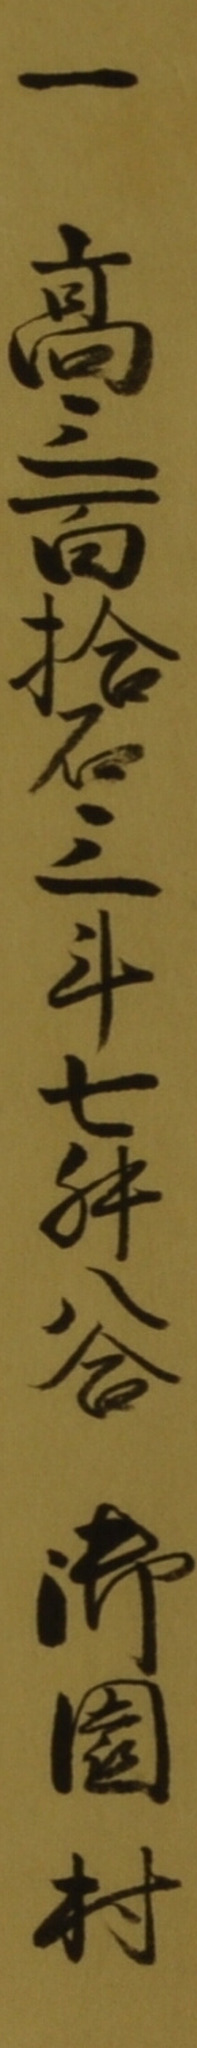一高三百拾石三斗七升八合御園村
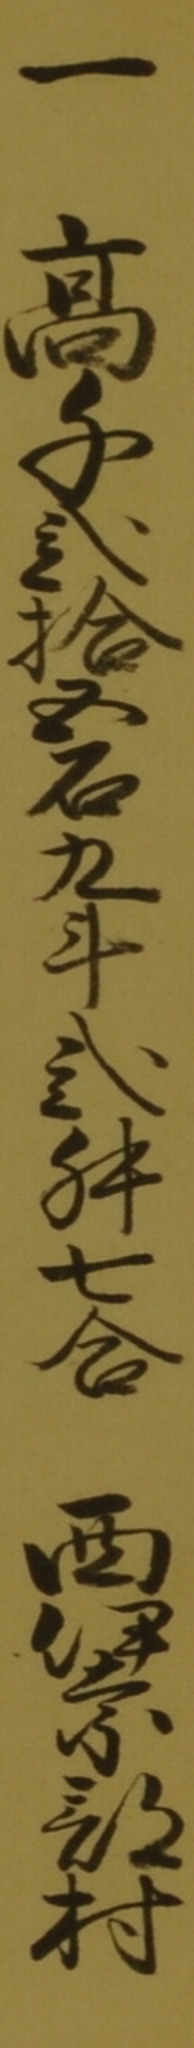一高千弐拾五石九斗弐升七合西伊奈部村
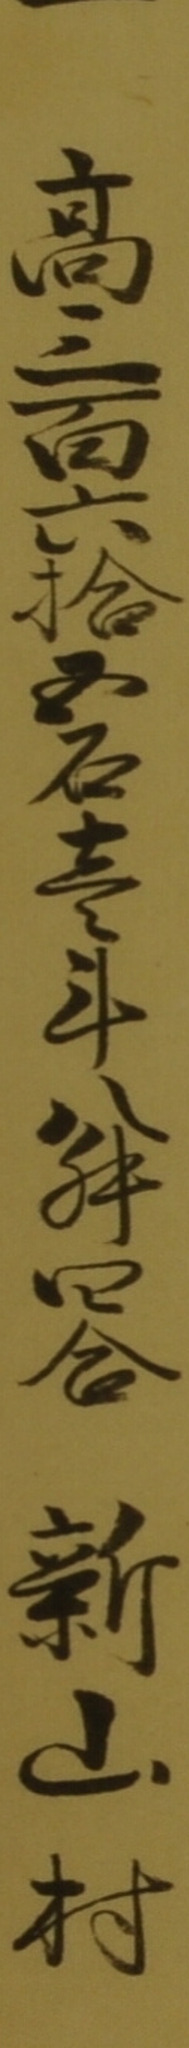一高三百六拾五石壱斗八升四合新山村
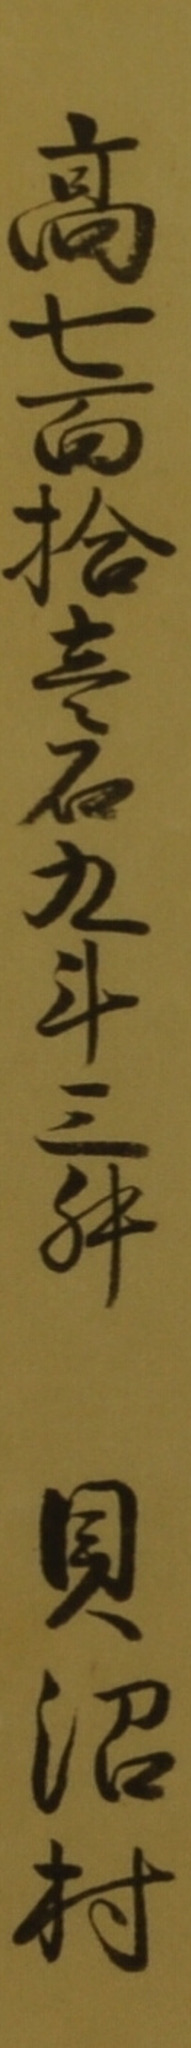一高七百拾壱石九斗三升貝沼村

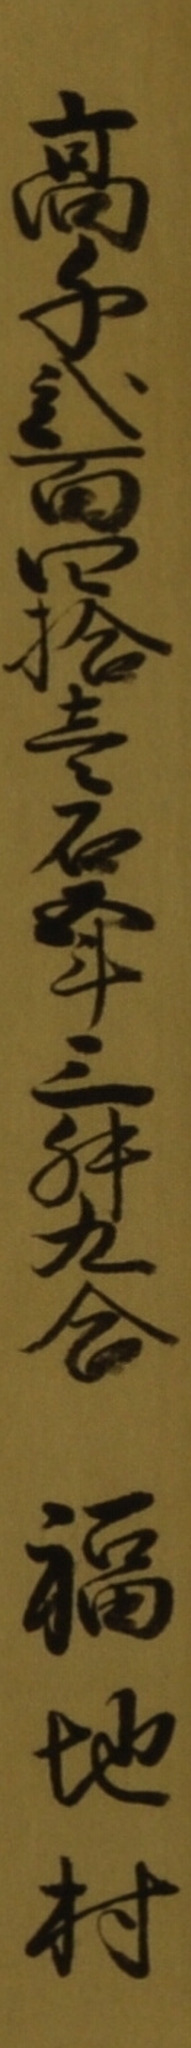一高千弐百四拾壱石五斗三升九合福地村
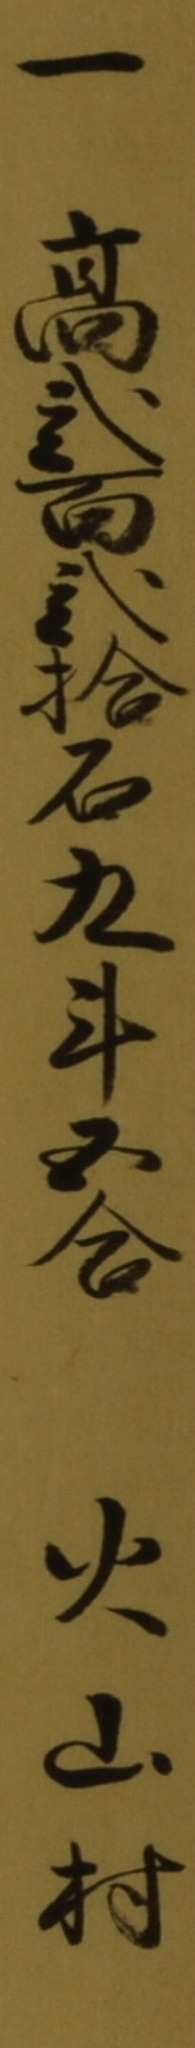一高弐百弐拾石九斗五合火山村
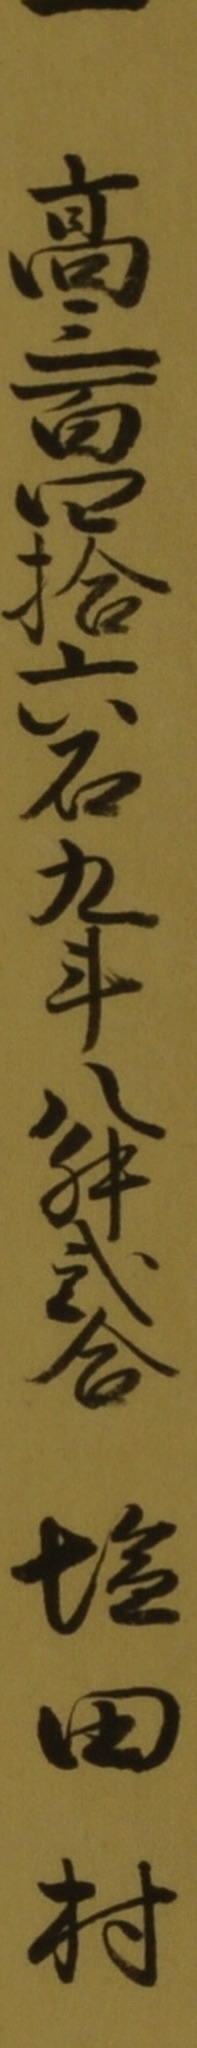一高三百四拾六石九斗八升弐合塩田村
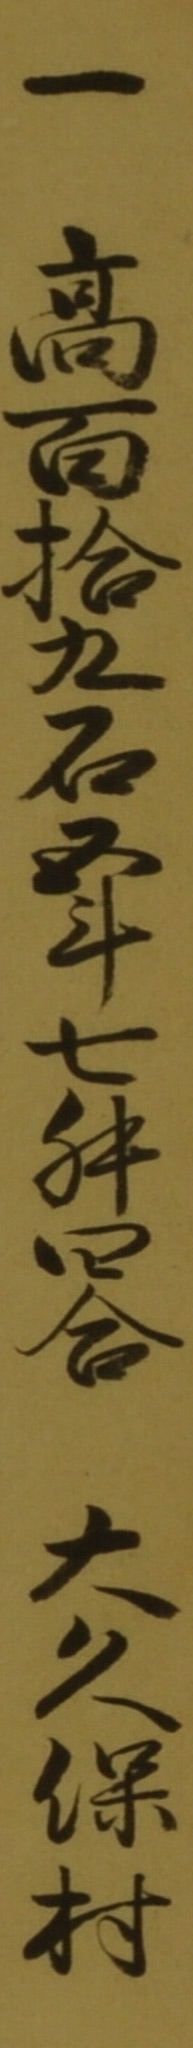一高百拾九石五斗七升四合大久保村
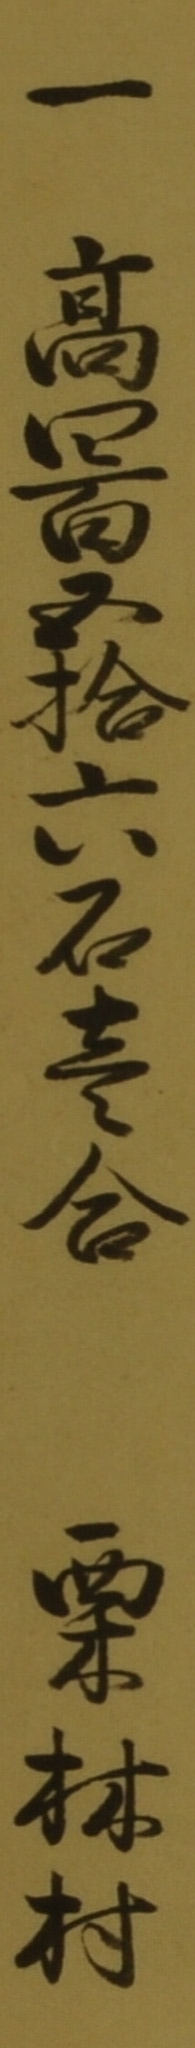一高四百五拾六石壱合栗林村
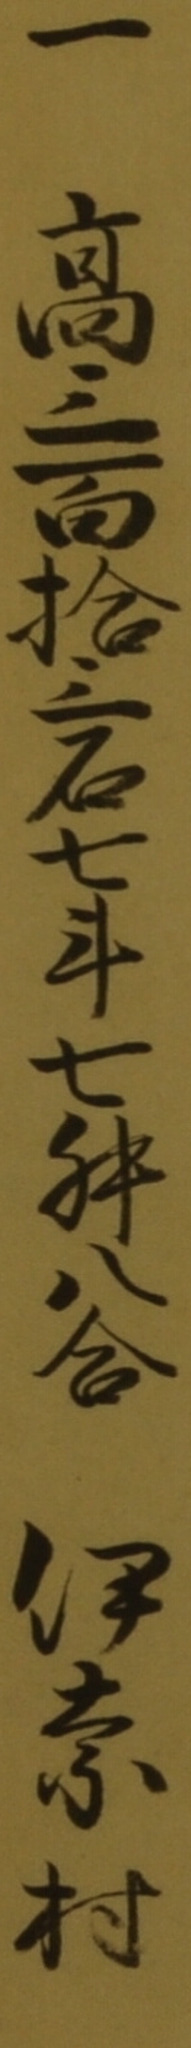一高三百拾三石七斗七升八合伊奈村

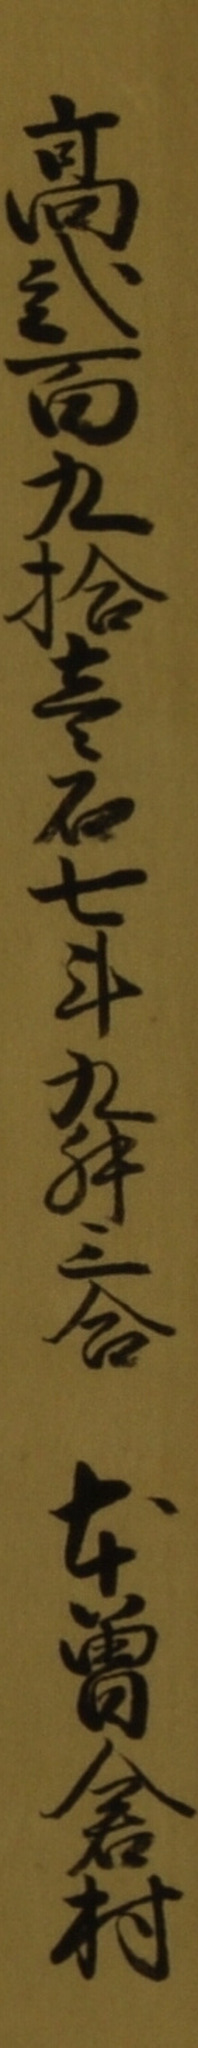一高弐百九拾壱石七斗九升三合本曾倉村
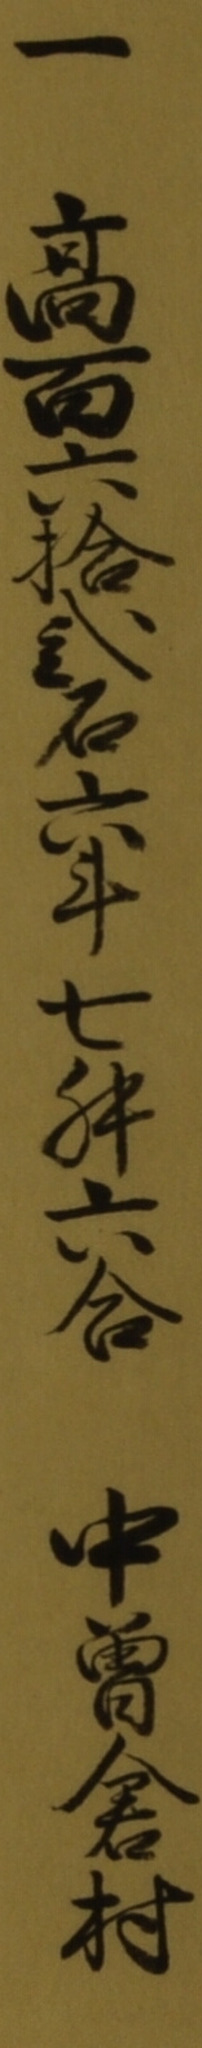一高百六拾弐石六斗七升六合中曾倉村
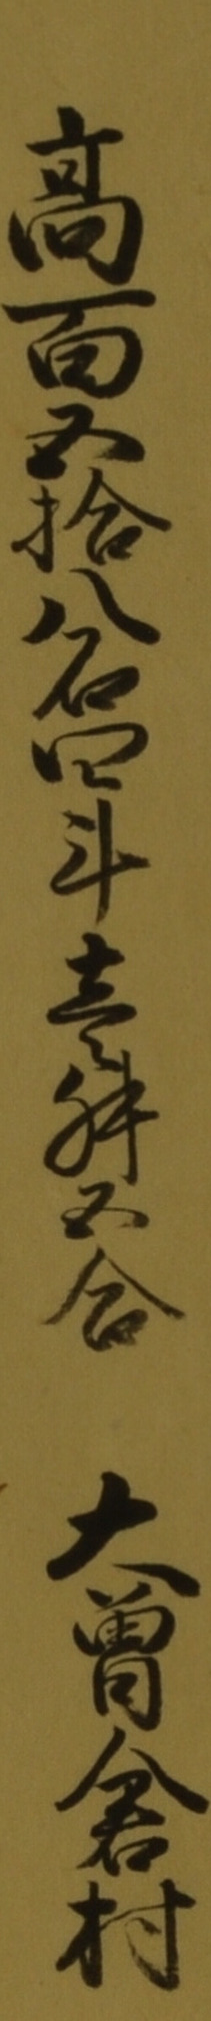一高百五拾八石四斗壱升五合大曾倉村
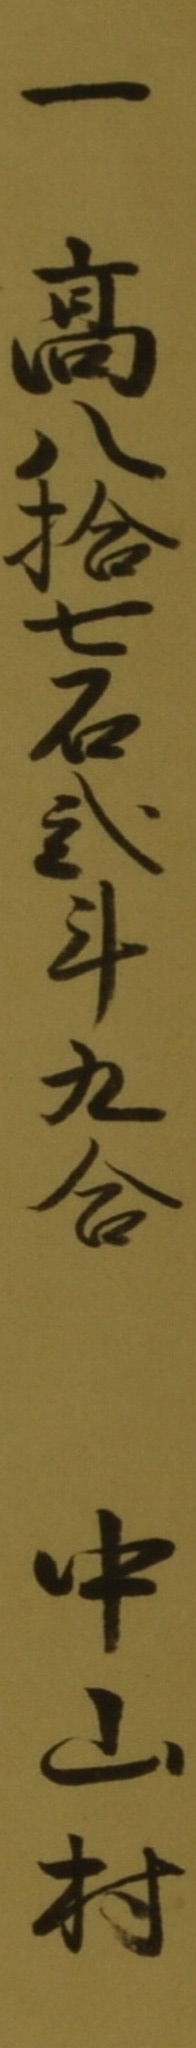一高八拾七石弐斗九合中山村
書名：信濃国伊那郡筑摩郡高遠領知郷村高辻帳
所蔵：伊那市立高遠町図書館・合同会社AMANE
